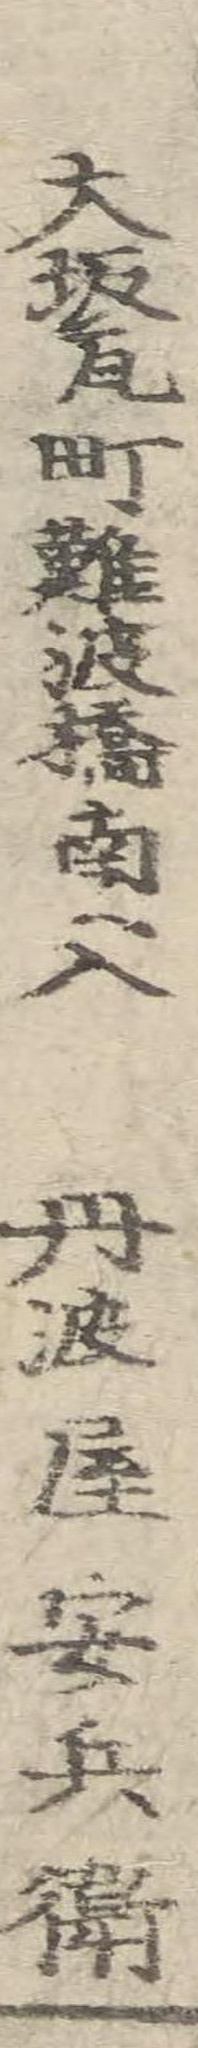同大坂瓦町難波橋南へ入丹波屋安兵衛
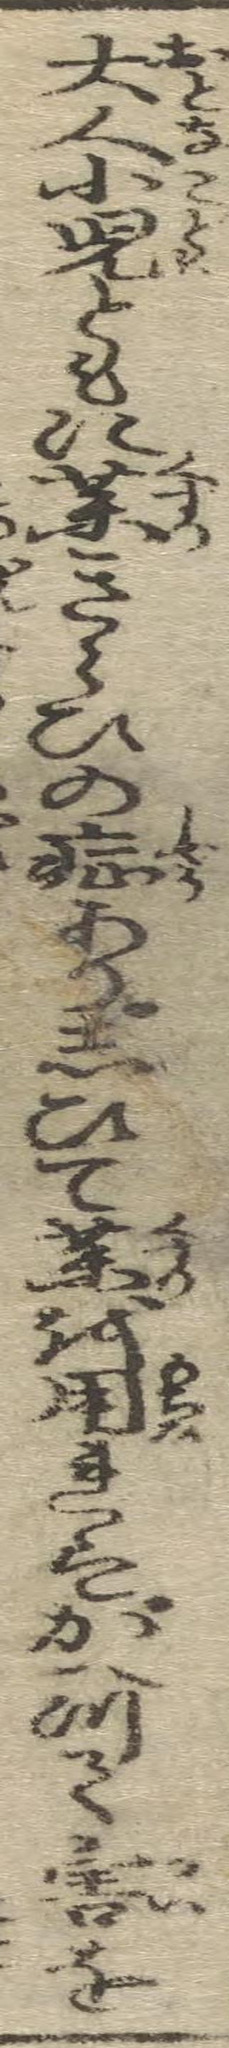大人小児ともに薬きらひの症あり。しひて薬を用れは。かへつて害を
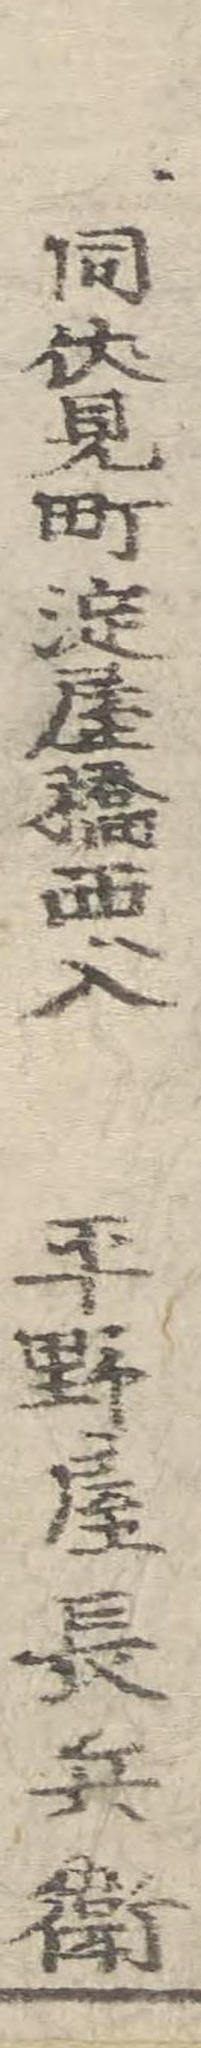同同伏見町淀屋橋西へ入平野屋長兵衛
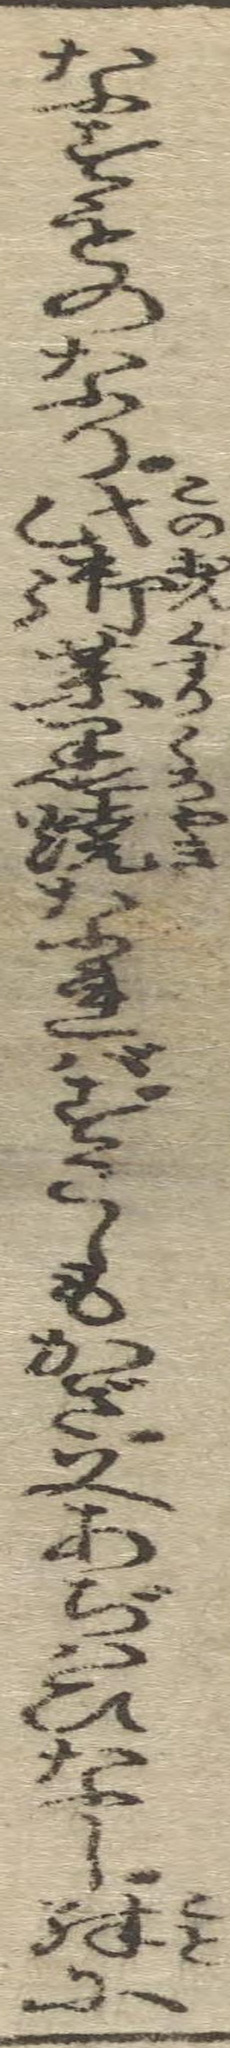なすものなり。此御薬黒焼なれば。すこしもかぎ。又あぢはひなし。殊に
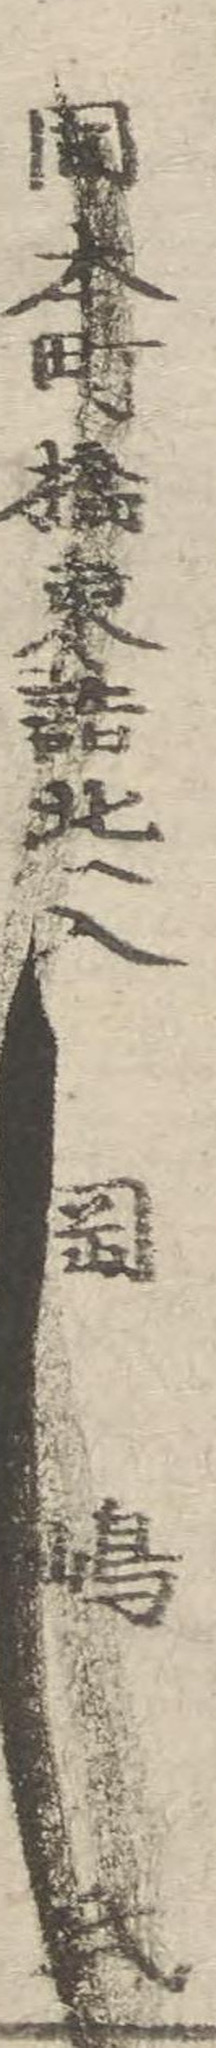同同本町橋東詰北へ入岡嶋氏
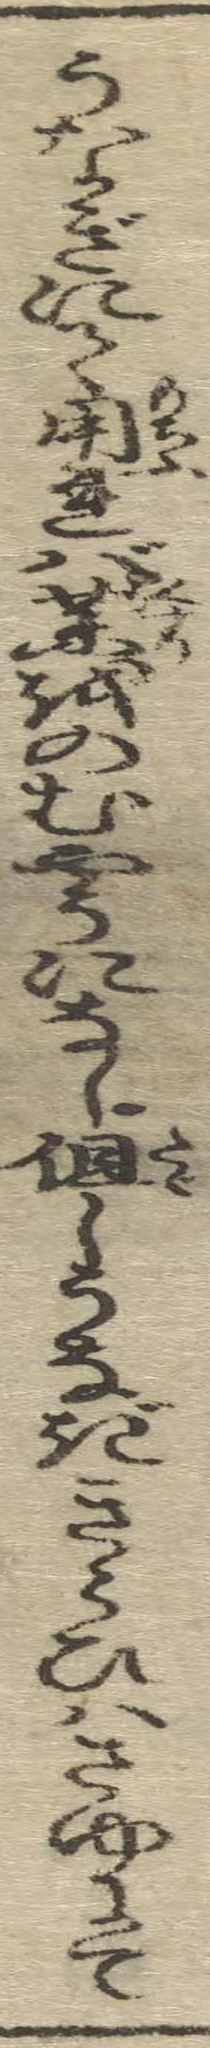うなぎにて用れば。薬をのむやうになし。但しうなぎきらひはさゆにて
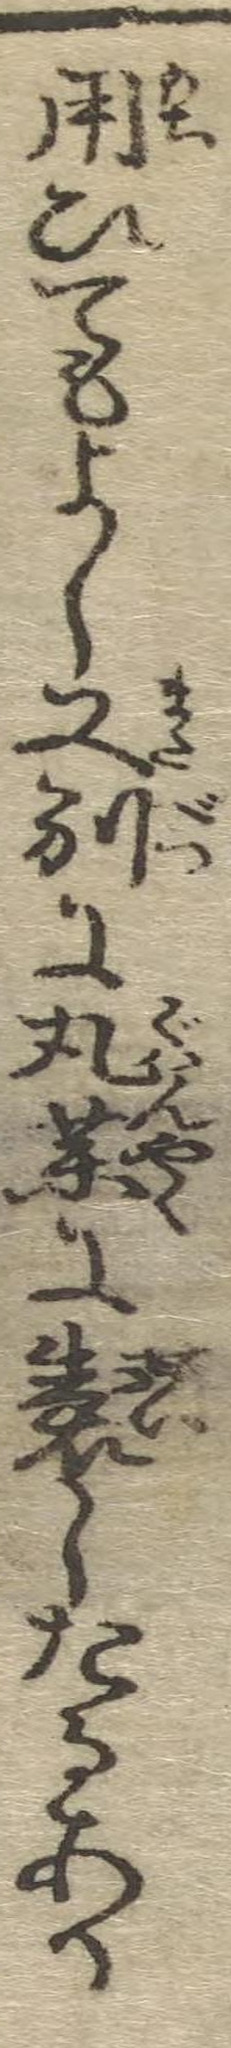用ひてもよし又別に丸薬に製したるあり
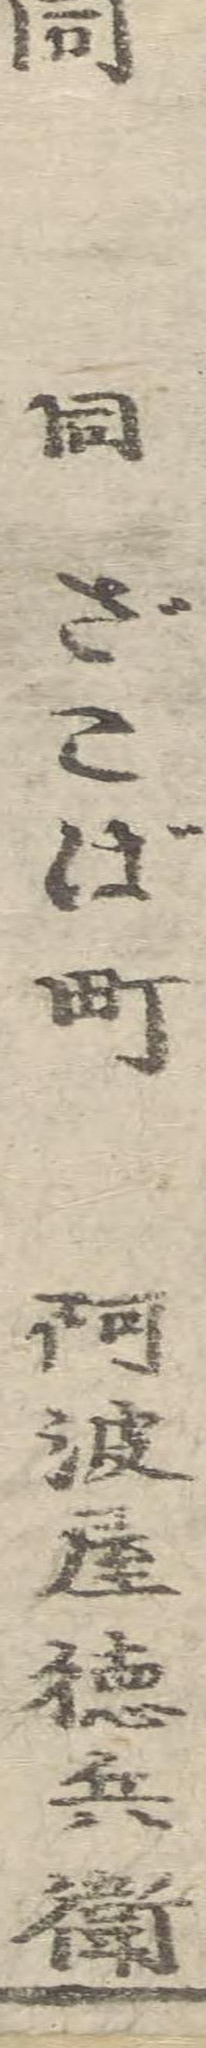同同ざこば町阿波屋徳兵衛
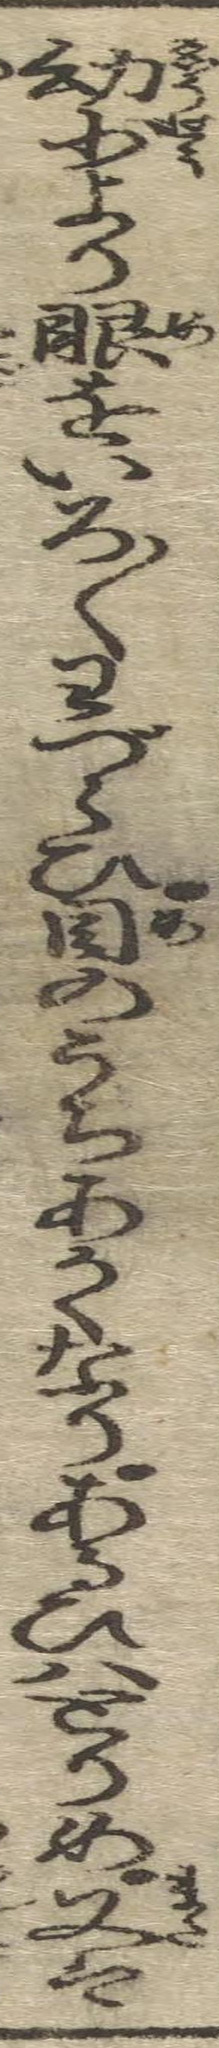幼少より眼をいろ〳〵わづらひ。目のうちあかくなり。あるひはとりめ。又は
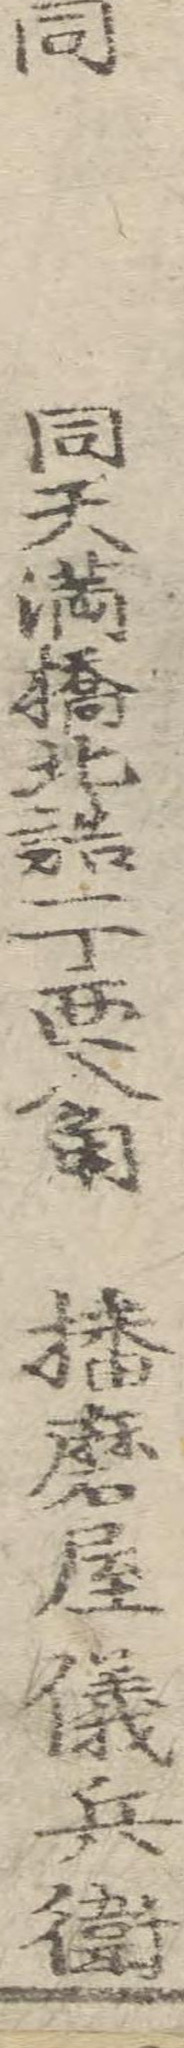同同天満橋北詰一丁西へ入角播磨屋儀兵衛
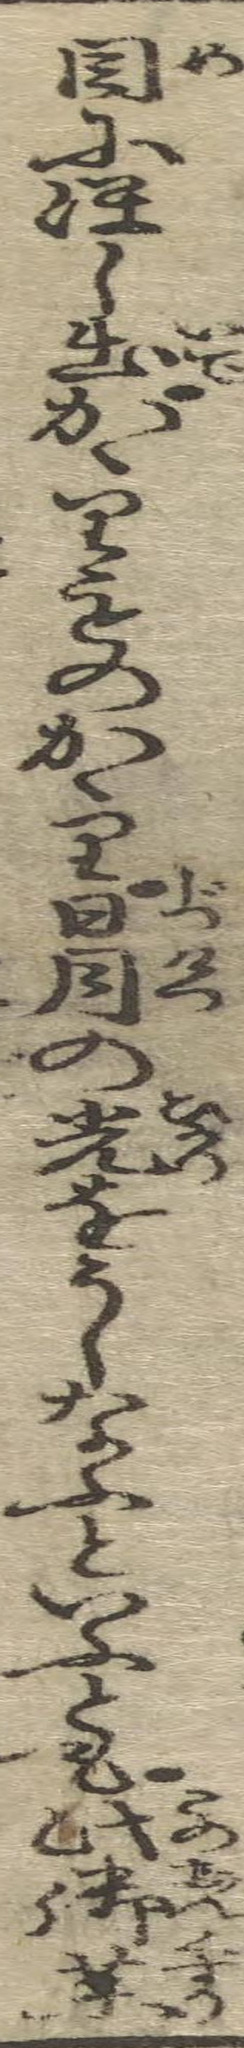目にほし出。かゝりものかゝり。日月の光をうしなふといふとも。此御薬
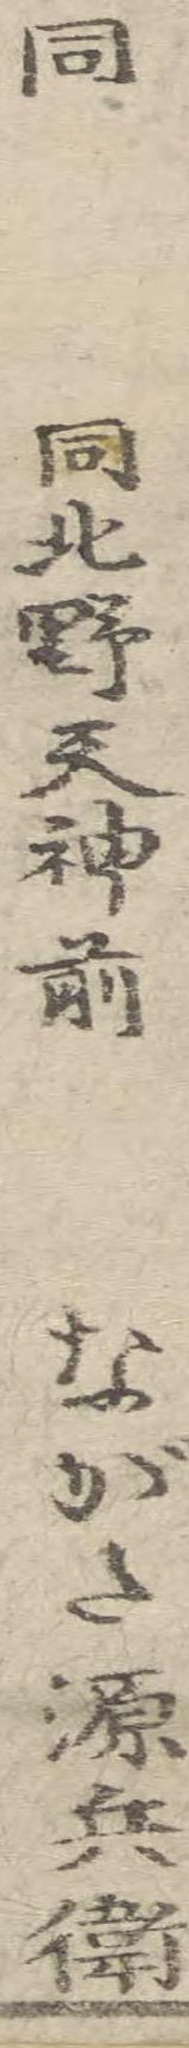同同北野天神前ながた源兵衛
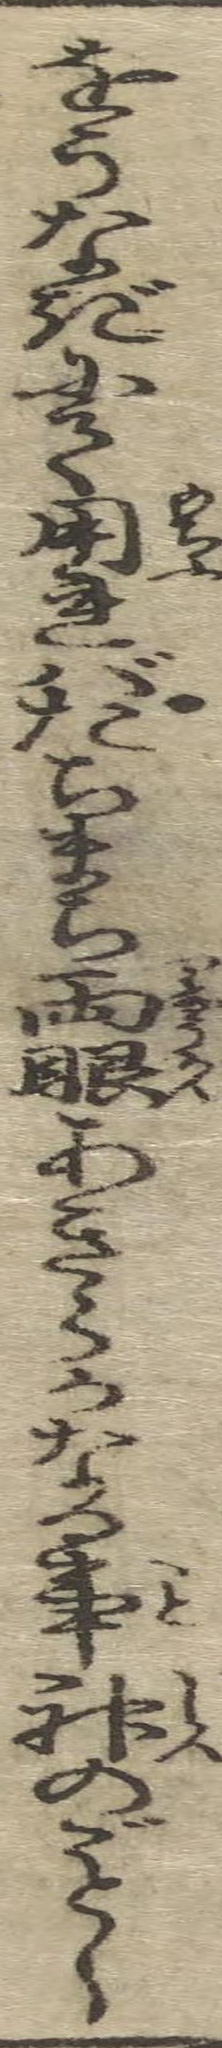をうなぎにて用れば。たちまち両眼あきらかなる事神のごとし
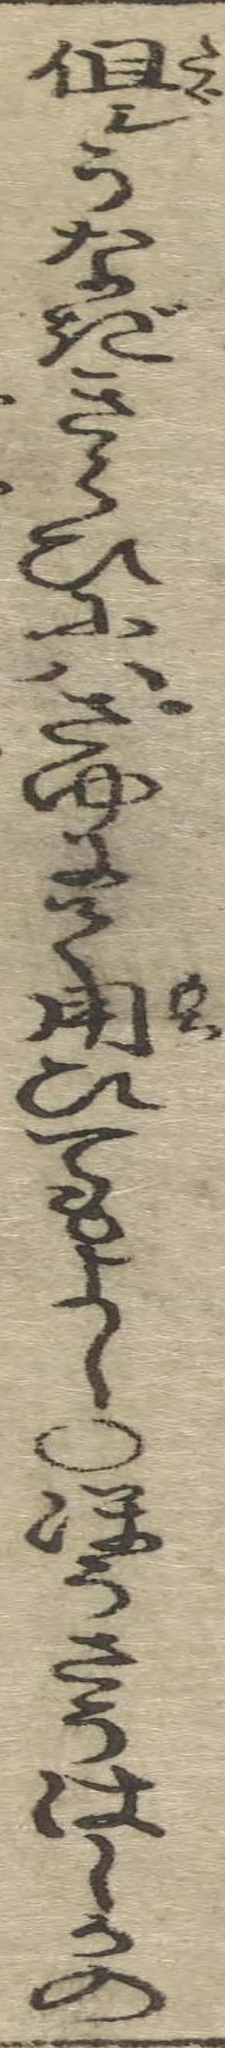但しうなぎきらひには。さゆにて用ひてもよし○ほうさうはしかの
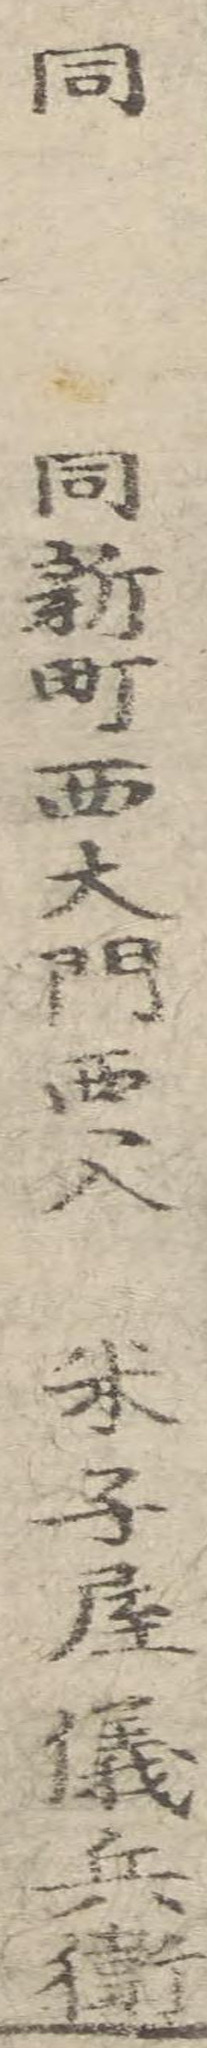同同新町西大門西へ入米子屋儀兵衛
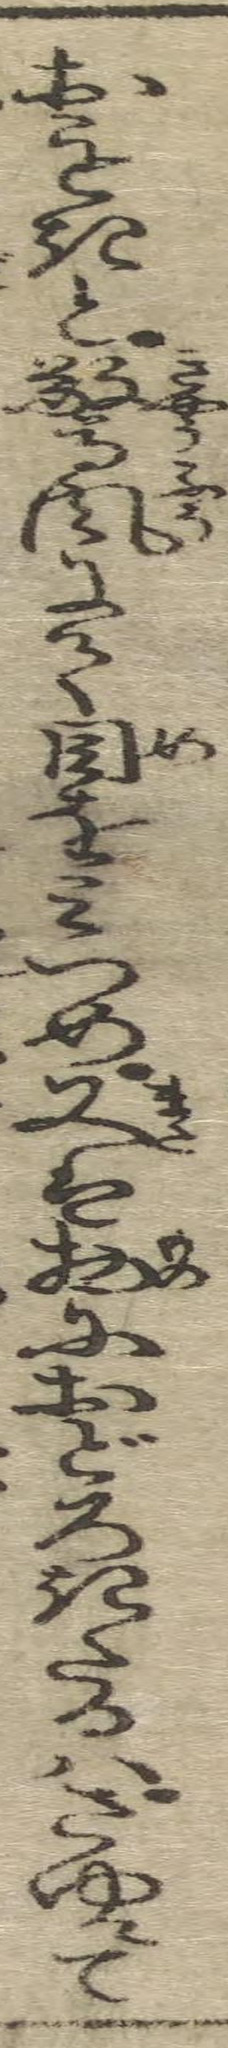おもきと。驚風にて目をみつめ。又は物におどろきたるは。さゆにて
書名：浪華薬種問屋能書張交帖. 二
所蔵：国立国会図書館 National Diet Library, JAPAN
